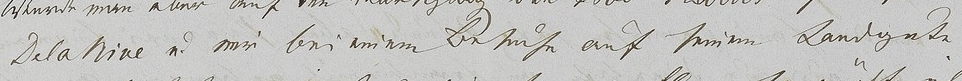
Dela Rive u. mir bei einem Besuche auf seinem Landgute
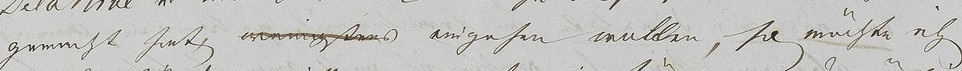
gemacht hat, wenigstens eingehen wollen, so möchte ich
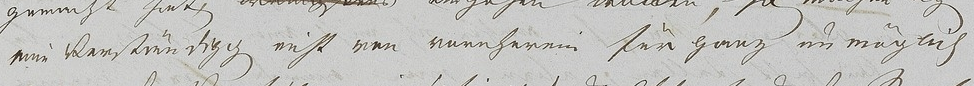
eine Verständigg nicht von vornherein für ganz unmöglich
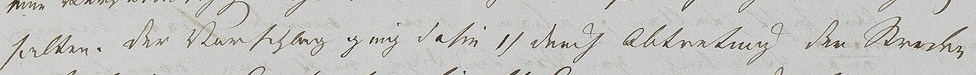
halten. Der Vorschlag ging dahin 1) durch Abtretung der Strecke
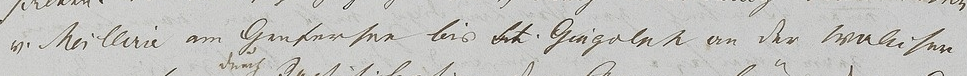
v. Meillerie am Genfersee bis St. Gingolph an der Walliser -
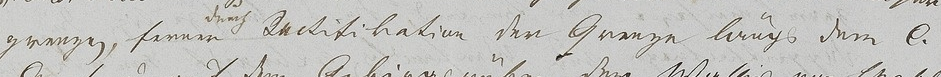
grenze, ferner durch Rectifikation der Grenze längs dem C.
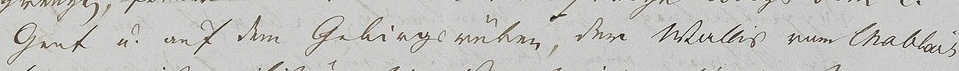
Genf u. auf dem Gebirgsrüken, der Wallis vom Chablais
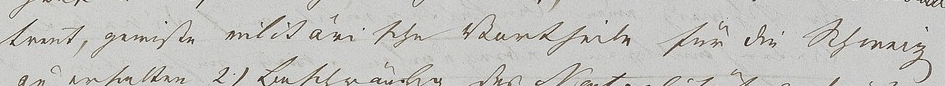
trennt, gewiße militärische Vortheile für die Schweiz
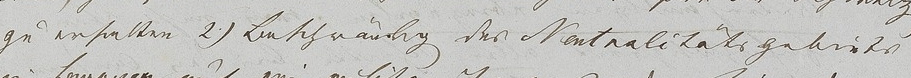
zu erhalten 2) Beschränkung des Neutralitätsgebiets
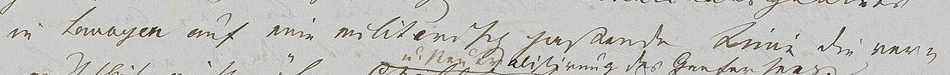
in Savoyen auf eine militärisch paßende Linie die ver-
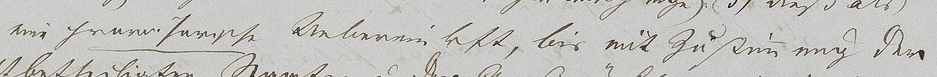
eine provisorische Uebereinkft, bis mit Zustimmung der
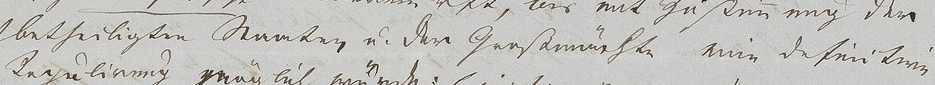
betheiligten Staaten u. der Großmächte eine definitive
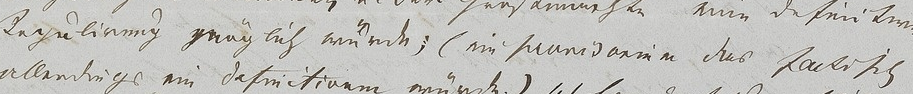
Regulirung möglich würde; (ein provisorium das factisch
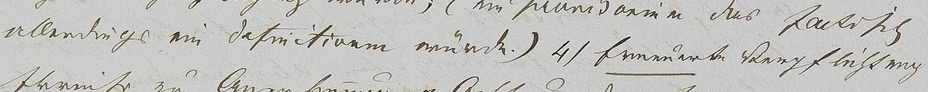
allerdings ein definitivum würde.) 4) Erneuerte Verpflichtung
